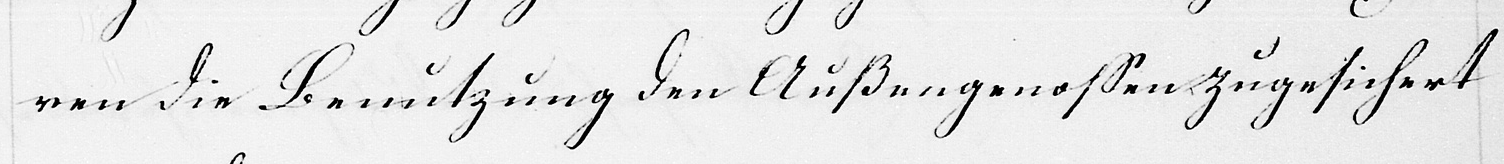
ren die Benutzung den Außengenoßen zugesichert
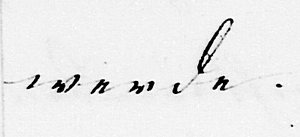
werde.
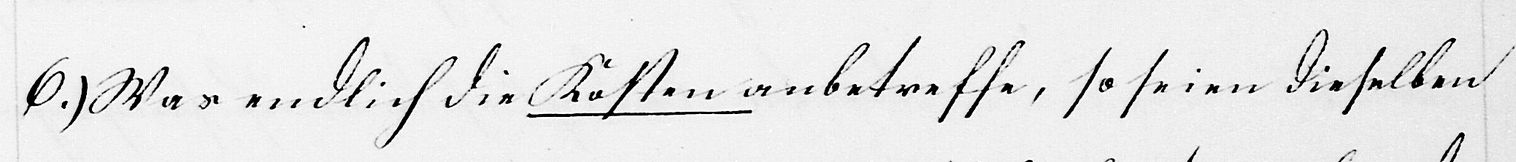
6.) Was endlich die Kosten anbetreffe, so seien dieselben
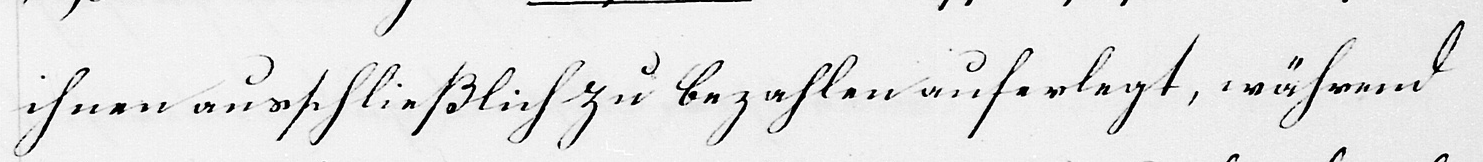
ihnen ausschließlich zu bezahlen auferlegt, während
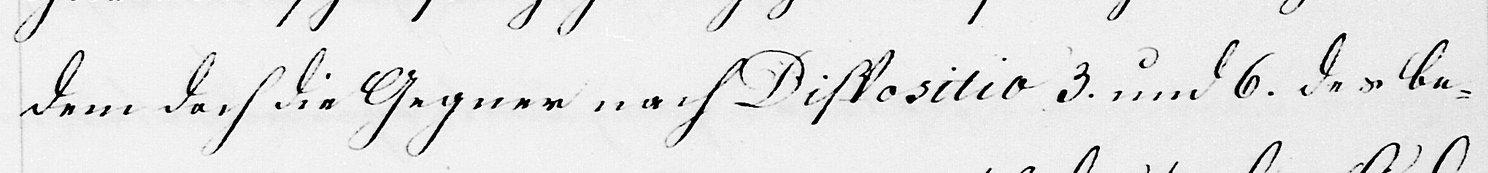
dem doch die Gegner nach Dispositio 3. und 6. des be¬
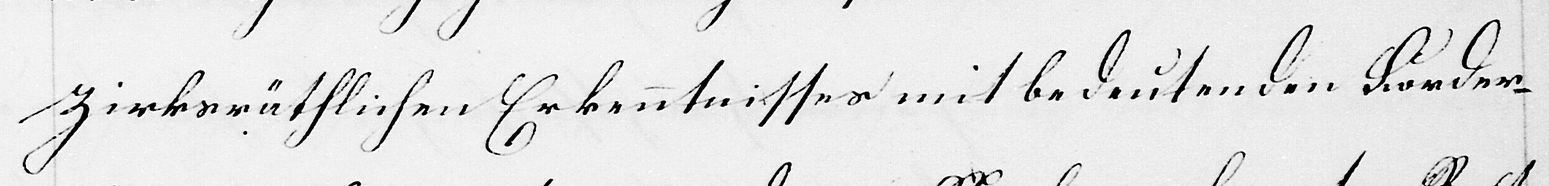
zirksräthlichen Erkenntnisses mit bedeutenden Forder¬
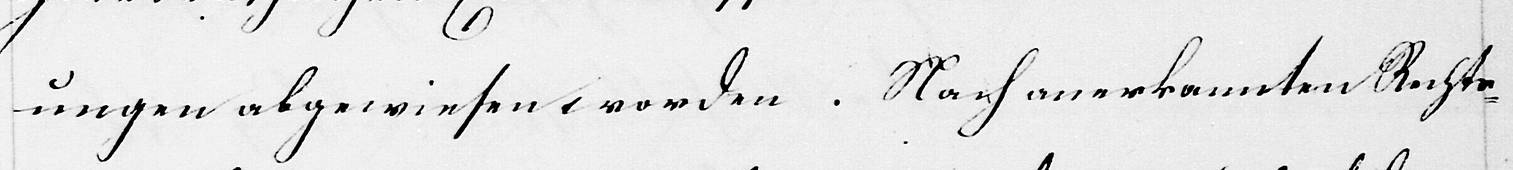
ungen abgewiesen worden. Nach anerkannten Rechts¬
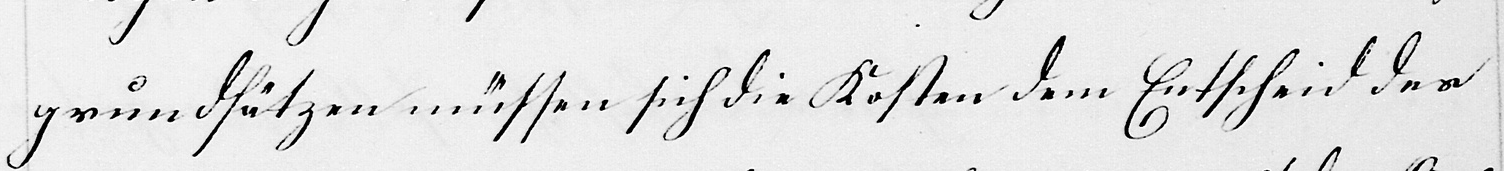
grundsätzen müssen sich die Kosten dem Entscheid des
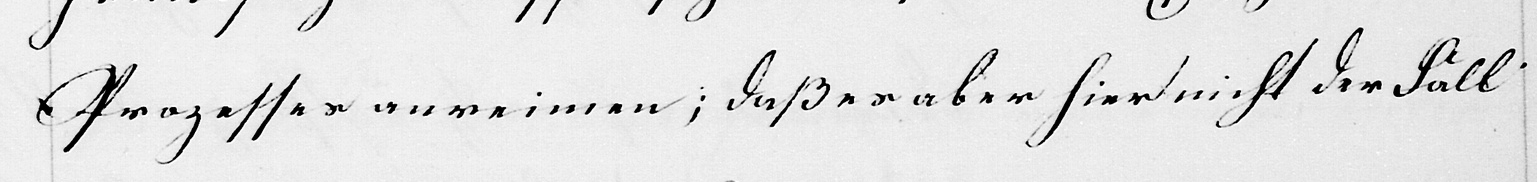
Prozesses anreimen; daß es aber hier nicht der Fall
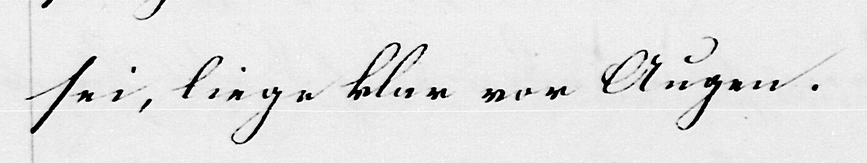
sei, liege klar vor Augen.
